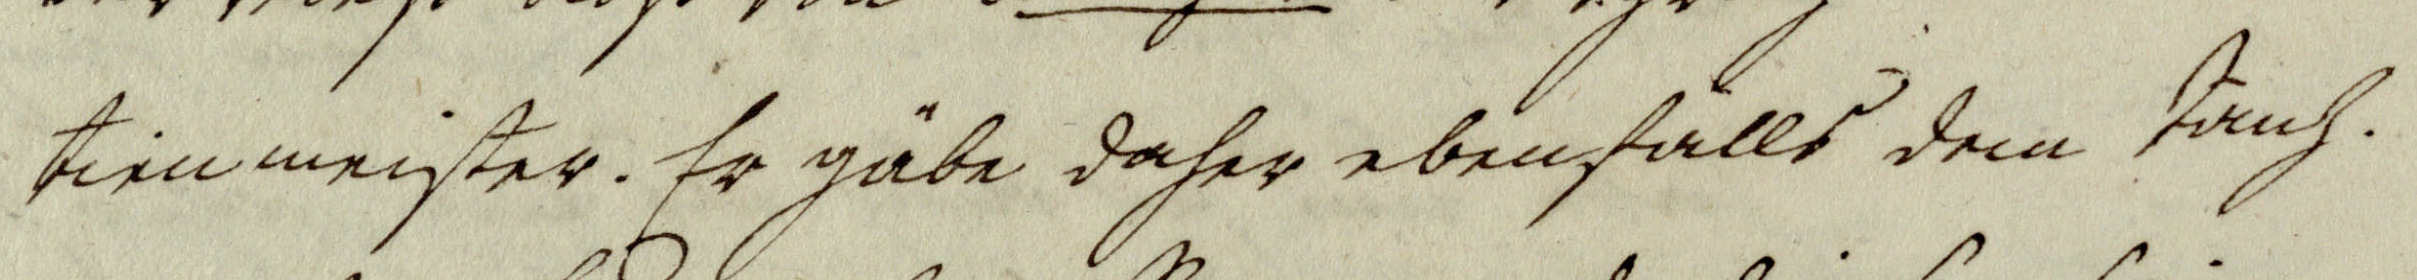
tienmeister. Er gäbe daher ebenfalls dem Tanz¬
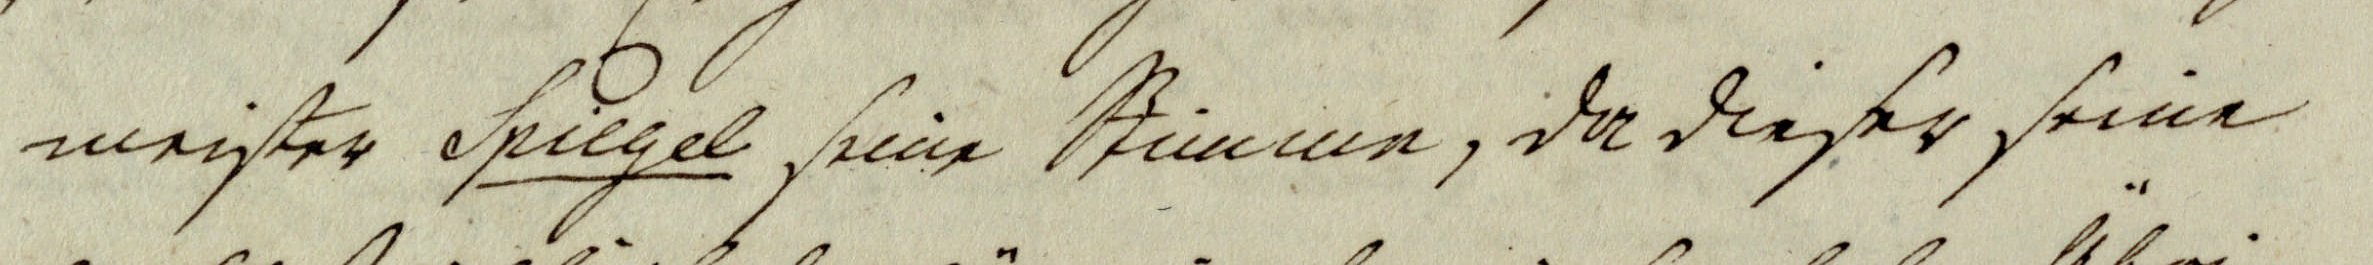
meister Spiegel seine Stimme, da dieser seine
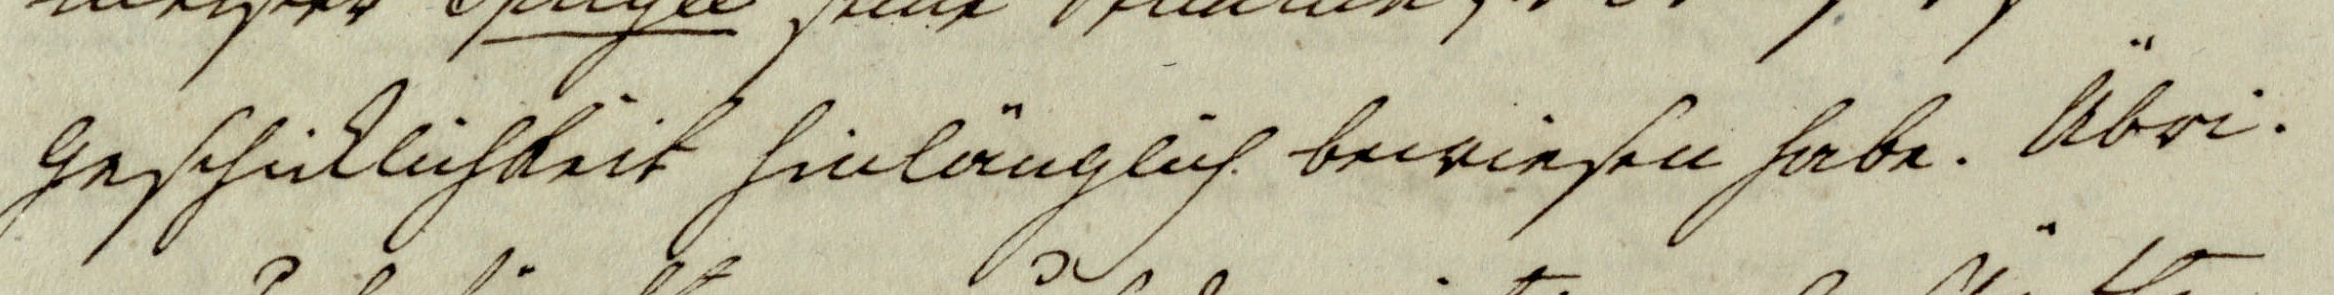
Geschicklichkeit hinlänglich bewiesen habe. Übri¬
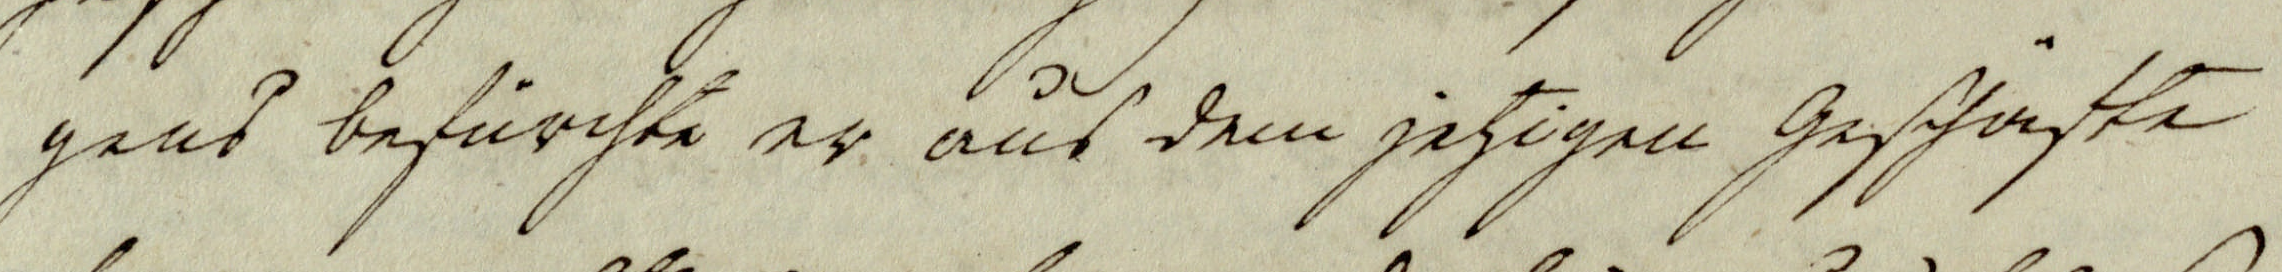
gens befürchte er aus dem jetzigen Geschäfte
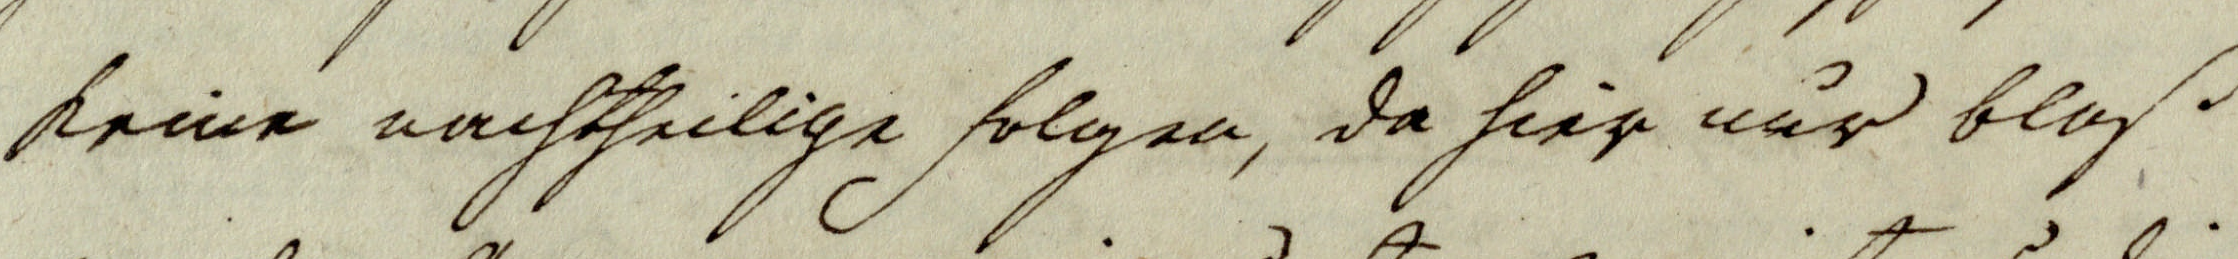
keine nachtheilige Folgen, da hier nur bloß
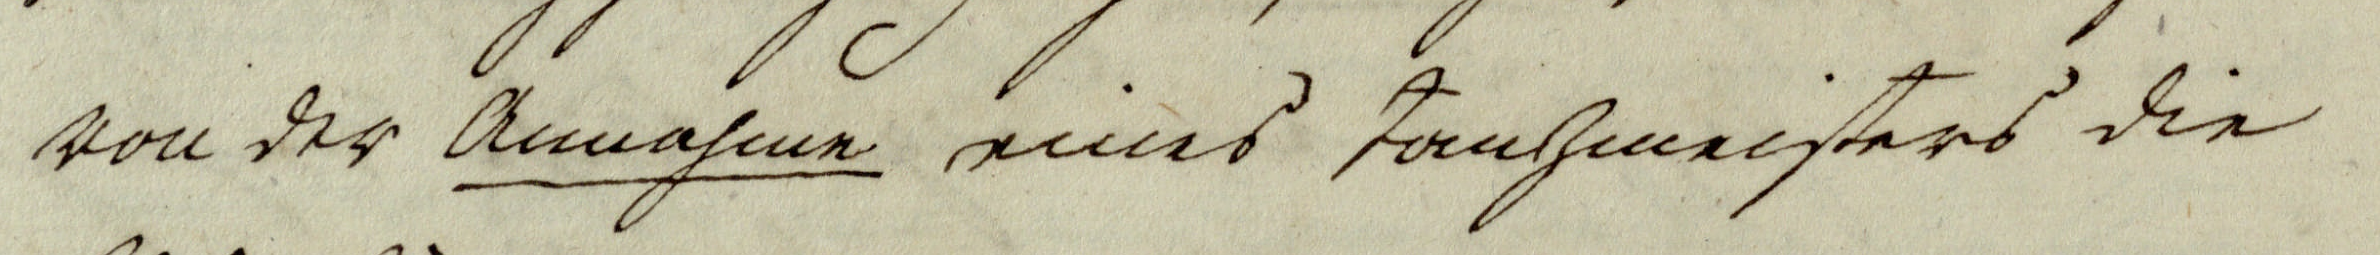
von der Annahme eines Tanzmeisters die
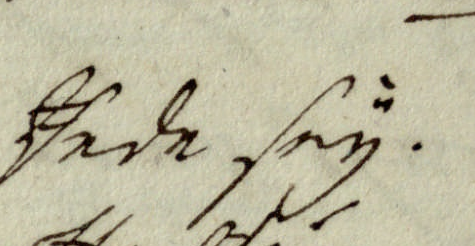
Rede seÿ.
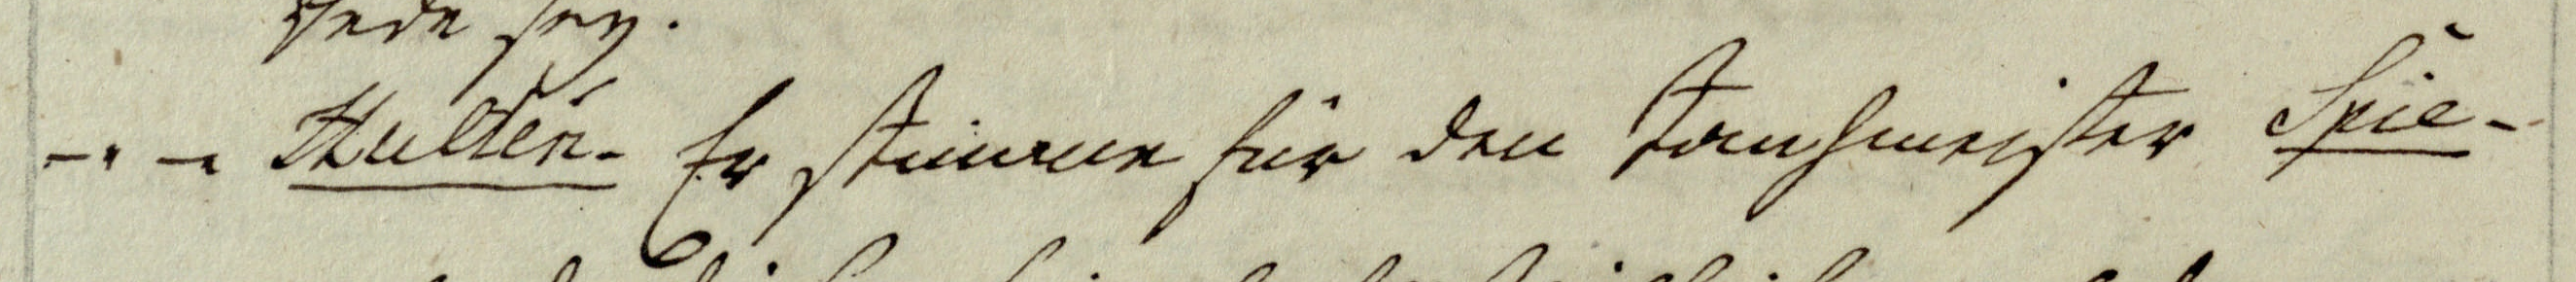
Hultén. Er stimme für den Tanzmeister Spie¬
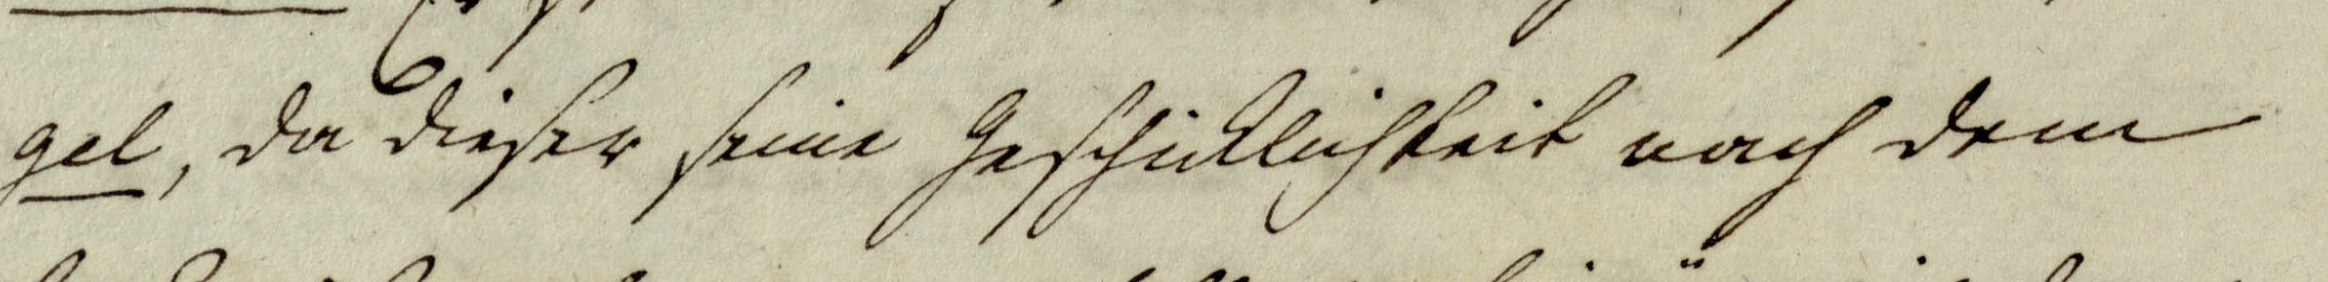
gel, da dieser seine Geschicklichkeit nach dem
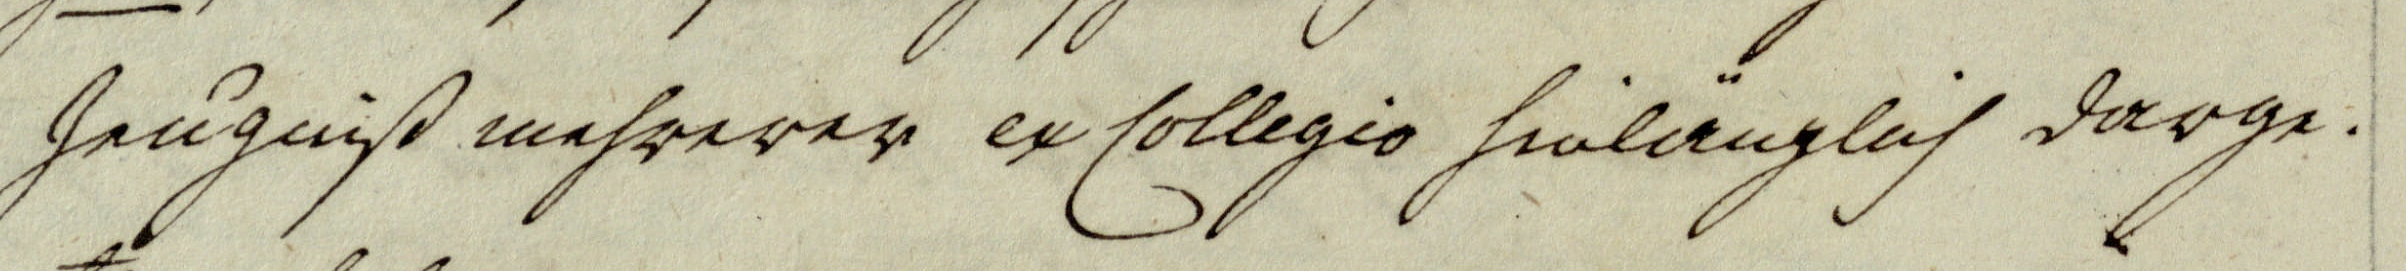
Zeugniß mehrerer ex Collegio hinlänglich darge¬
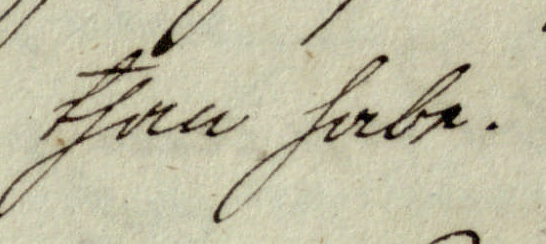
than habe.
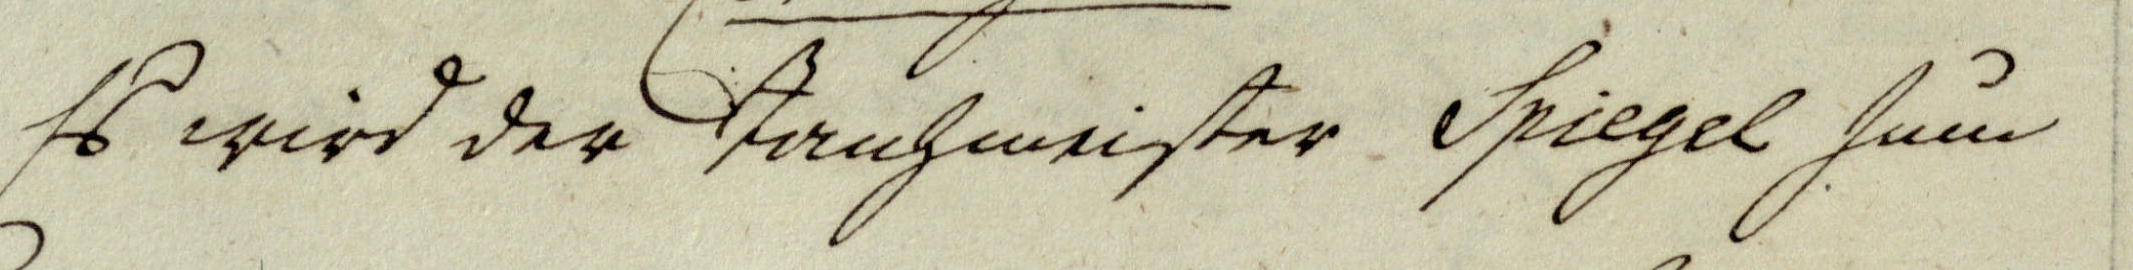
Es wird der Tanzmeister Spiegel zum
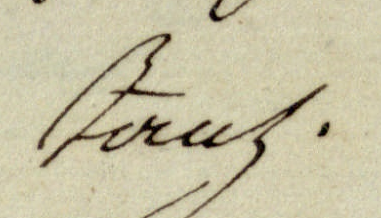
Tanz¬
